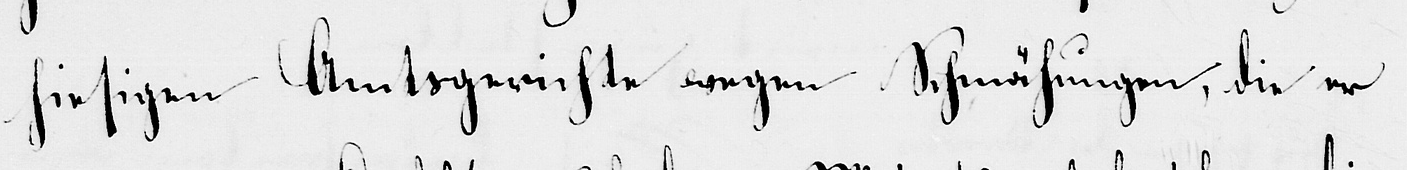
hiesigen Amtsgerichte wegen Schmähungen, die er
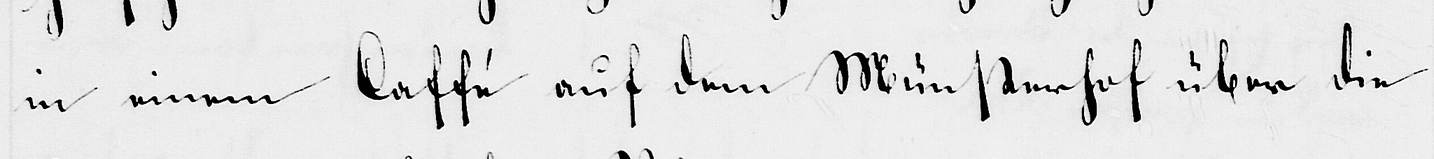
in einem Caffé auf dem Münsterhof über die
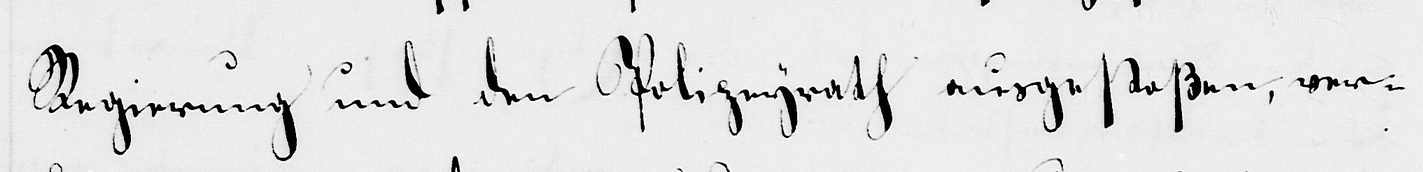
Regierung und den Polizeyrath ausgestoßen, ver¬
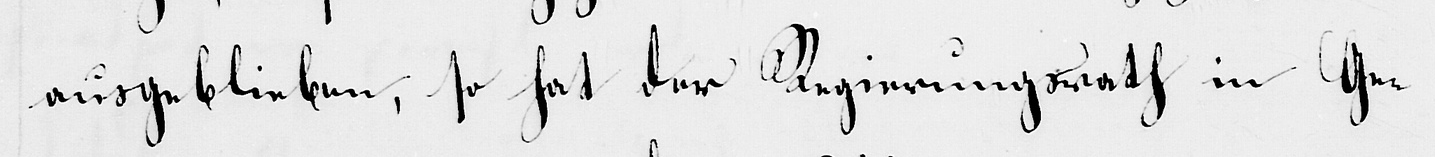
ausgeblieben, so hat der Regierungsrath in Ge¬
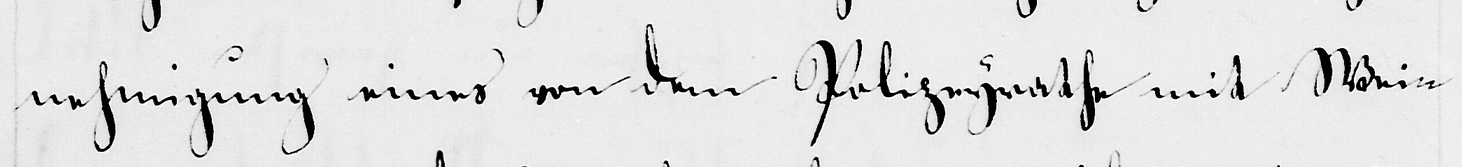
nehmigung eines von dem Polizeyrathe mit Wei¬
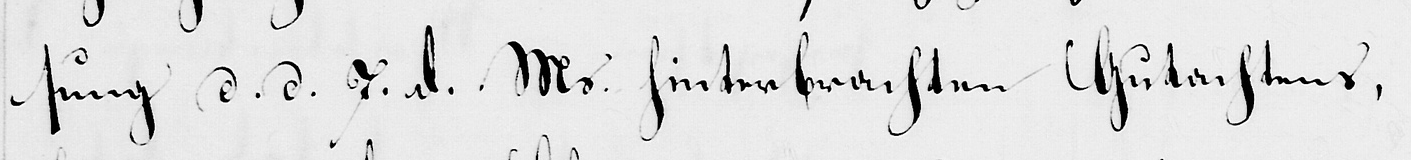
sung d. d. 7. d. Ms. hinterbrachten Gutachtens,
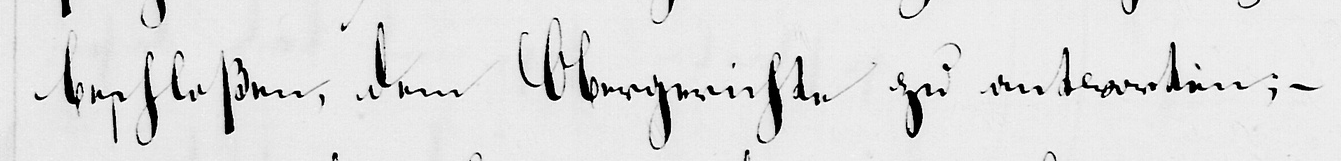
beschloßen, dem Obergerichte zu antworten: –
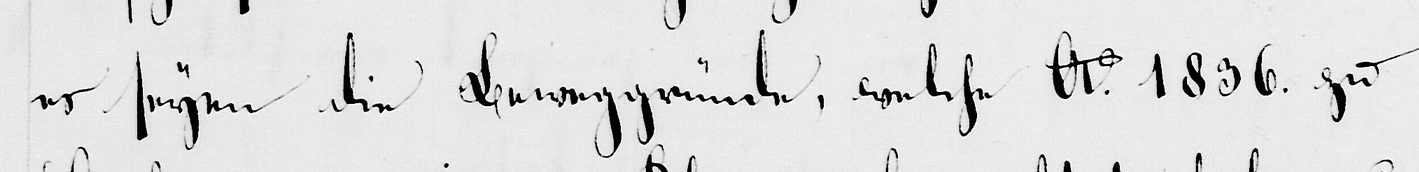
es seyen die Beweggründe, welche A°. 1836. zu
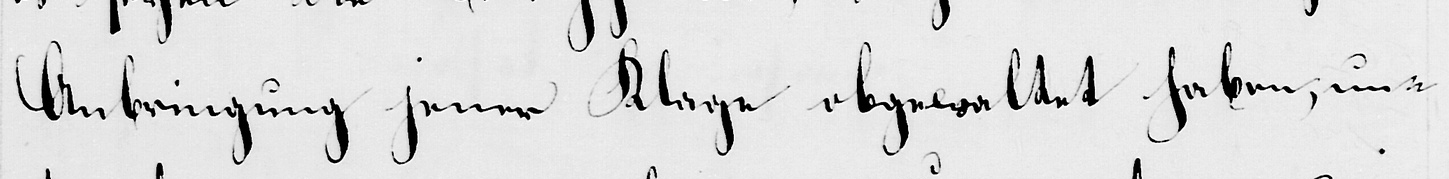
Anbringung jener Klage obgewaltet haben, un¬
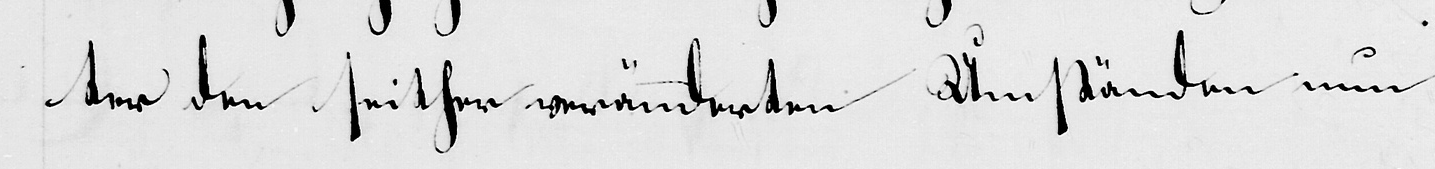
ter den seither veränderten Umständen nun
